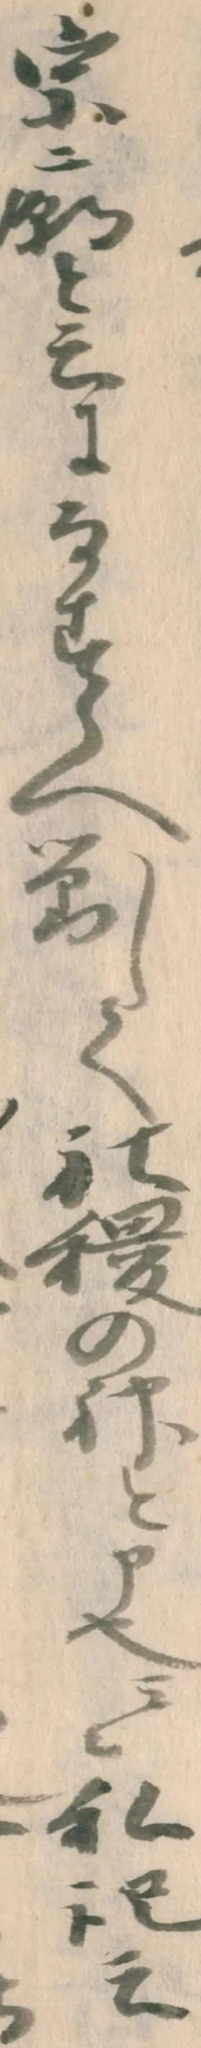宗廟と云になすらへ對して社稷の神と申也云々私記云
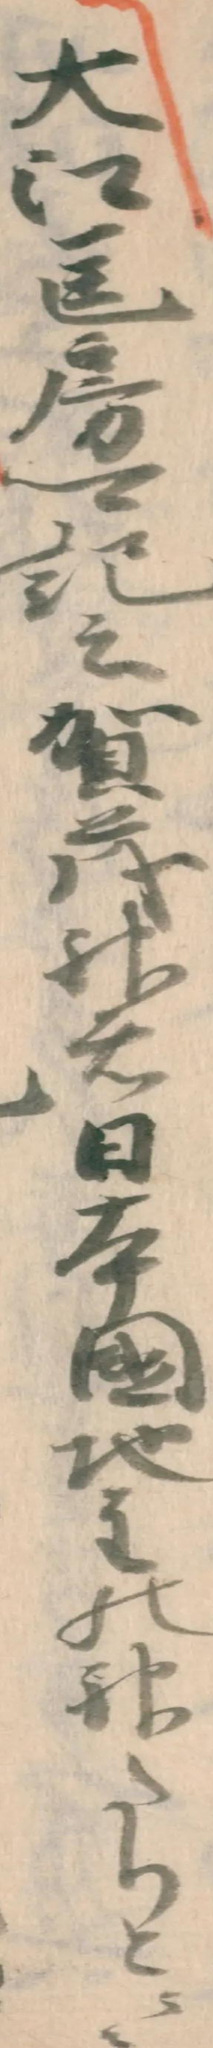大江匡房卿記云賀茂神は日本国地主の神たりと云々
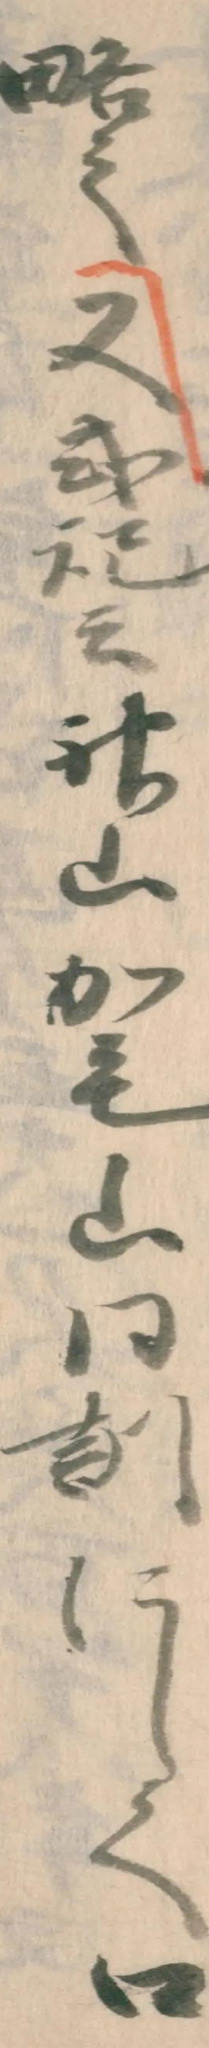略之又或記云神山加毛山同訓にして口
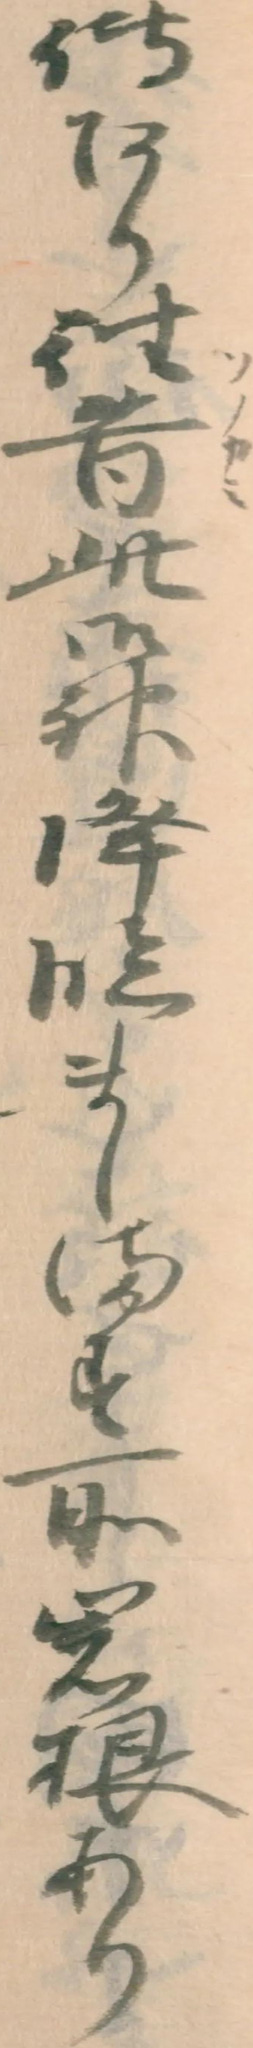伝あり往昔此御神降臨まします所岩根あり
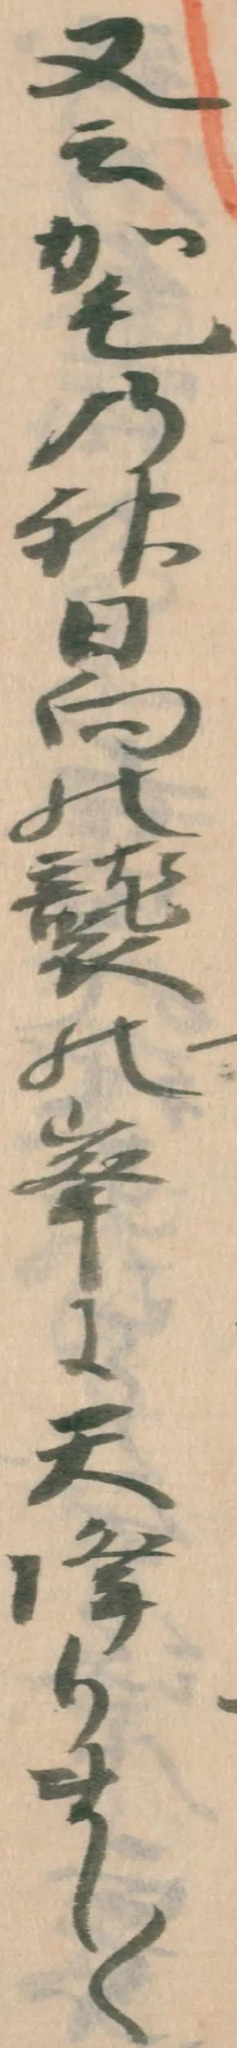又云加毛の神日向の襲の峯に天降りまし〳〵
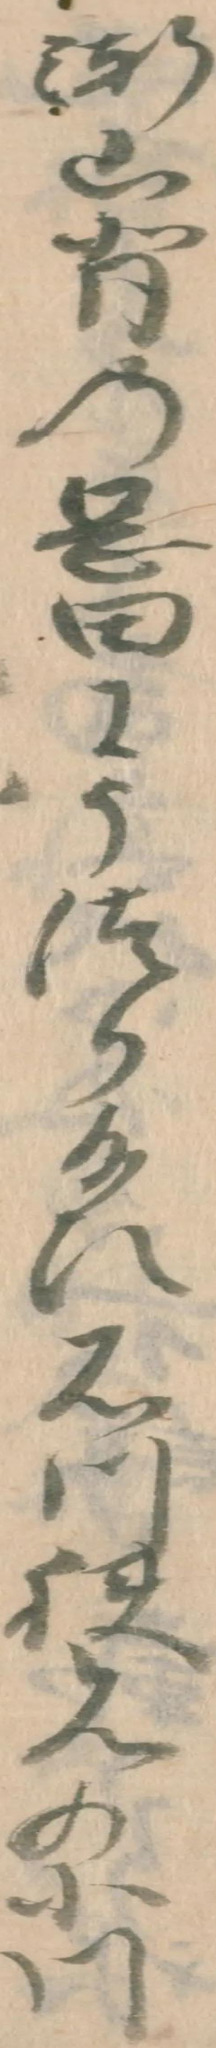漸山背の岡田にうつり給ひ石川狭見の小川
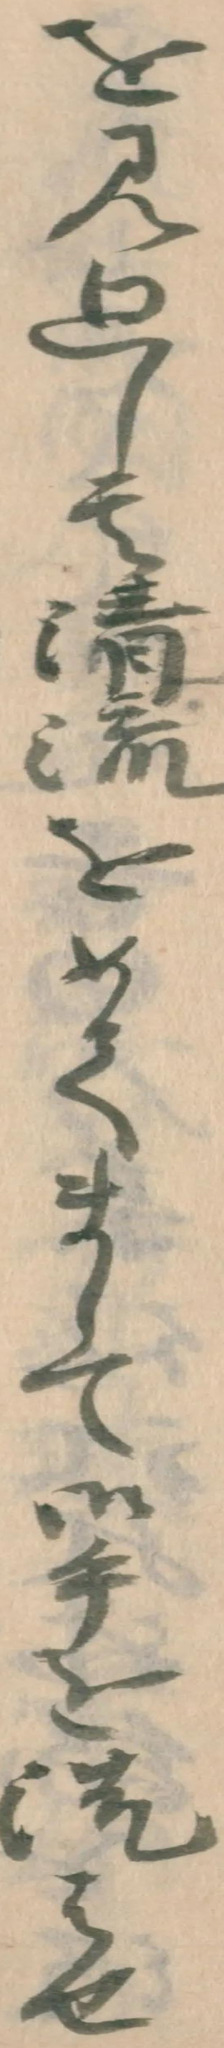を見廻し其清流をめてまして御手を洗はせ
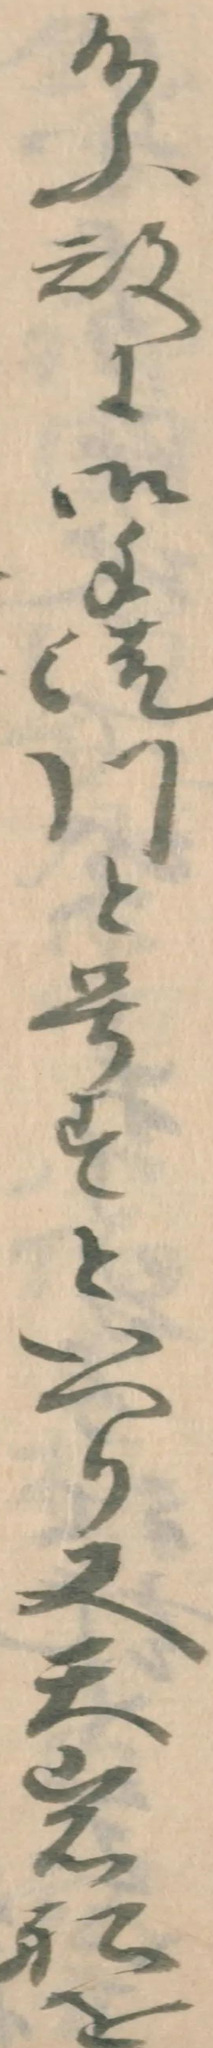給ふ故に御手洗川と号すといへり又天岩船を
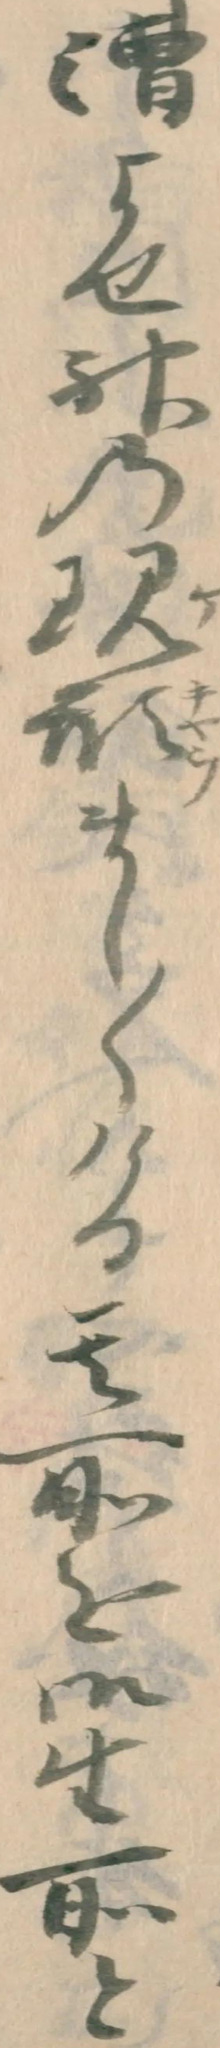漕よせ神の現形まし〳〵ける其所を御生所と
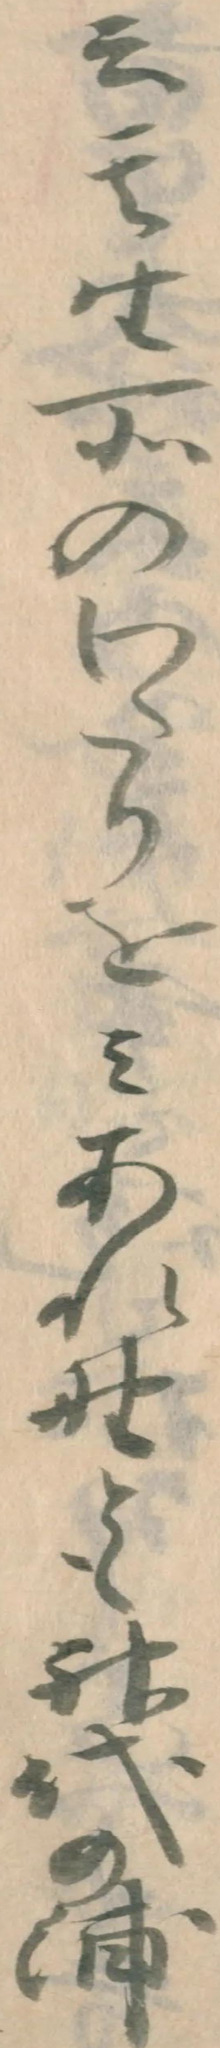云其生所のわたりをみあれ野とも神代の浦
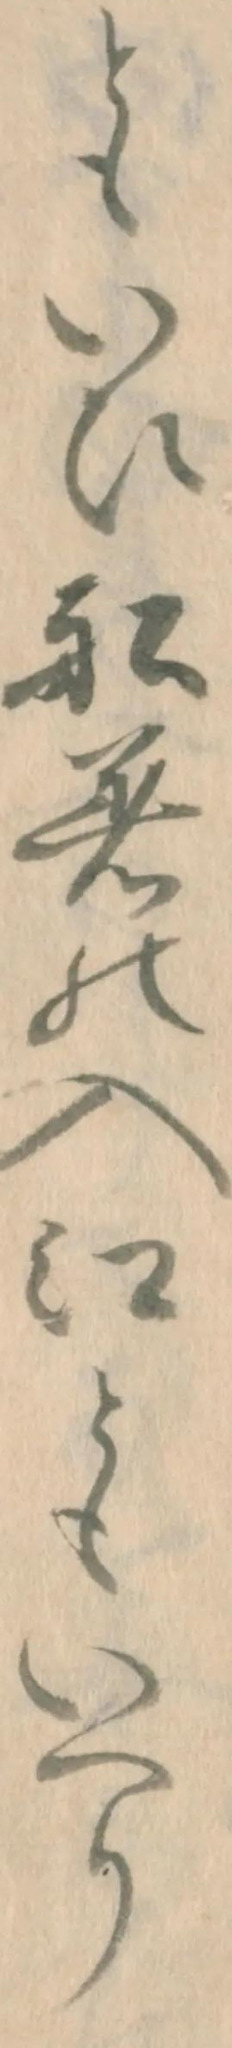ともいひ船着の入江ともいへり
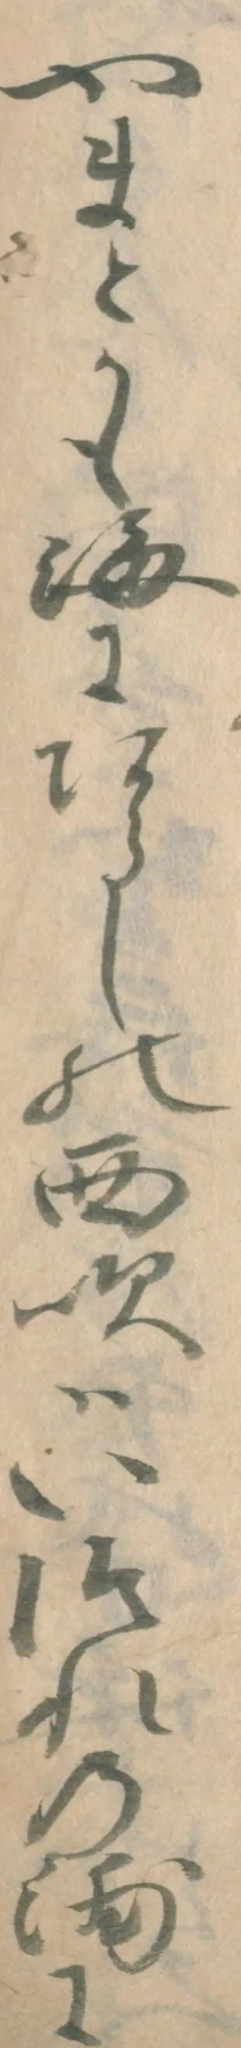やまとかも海にあらしの西吹はいつれの浦に

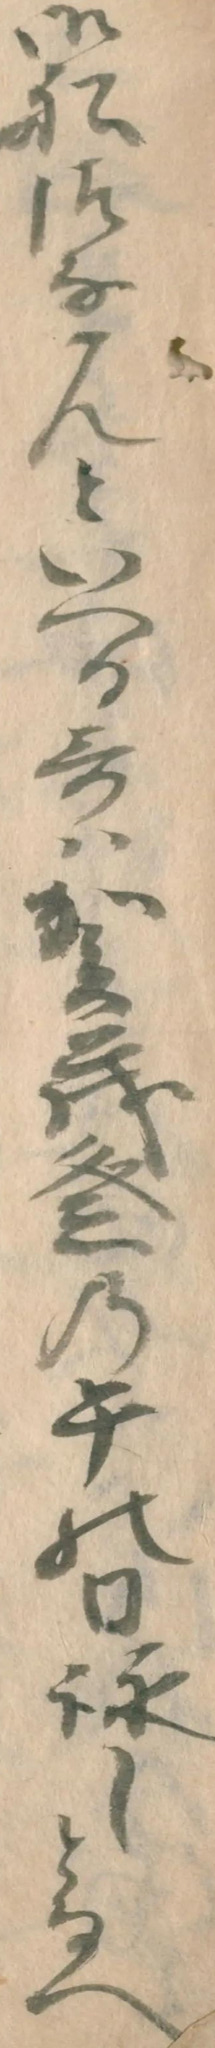御船つなかんといへる哥は賀茂祭の午の日詠しとなへ
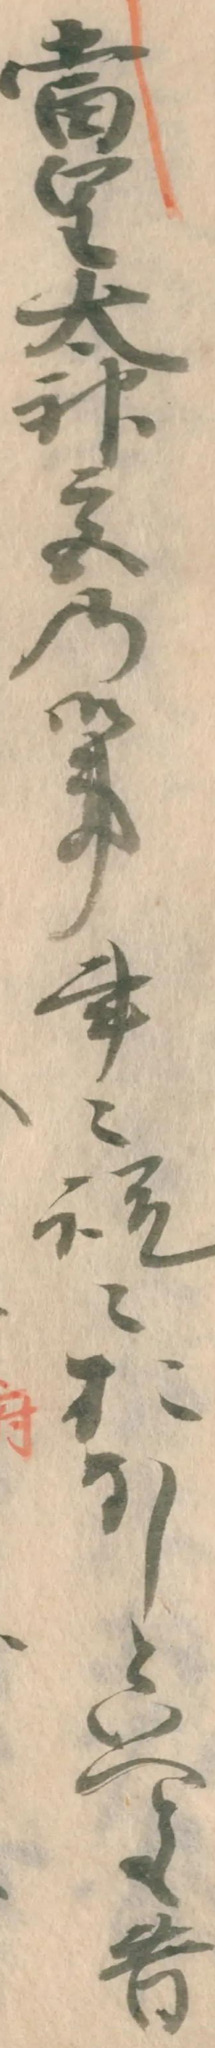当皇太神宮の御事書々説々おほしといへとも昔
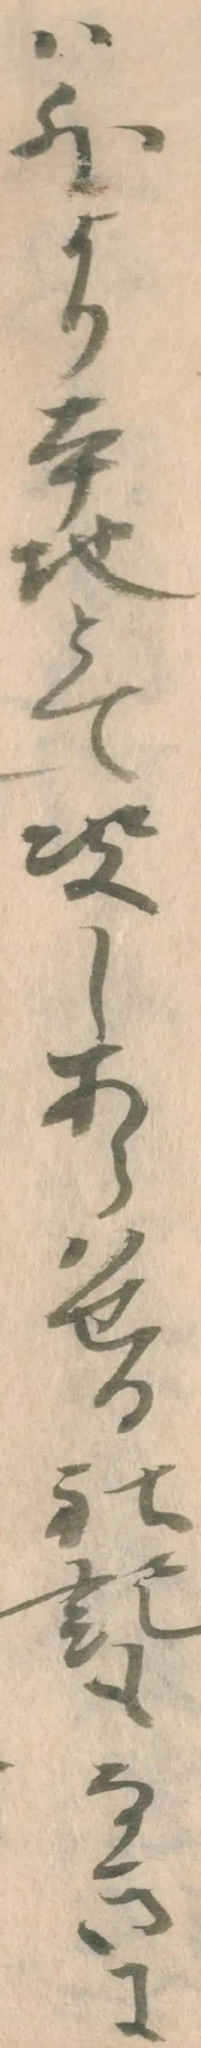は外より本地とて決しあらはせる社記もなきに
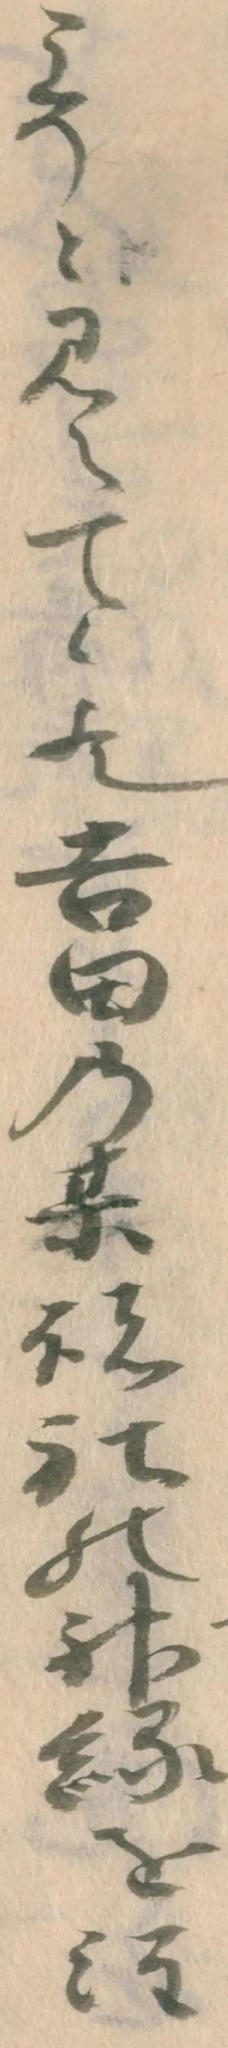こそと見えて候歟吉田の某諸社の神縁を注
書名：賀茂社記録. 第1冊
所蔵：国立国会図書館 National Diet Library, JAPAN
